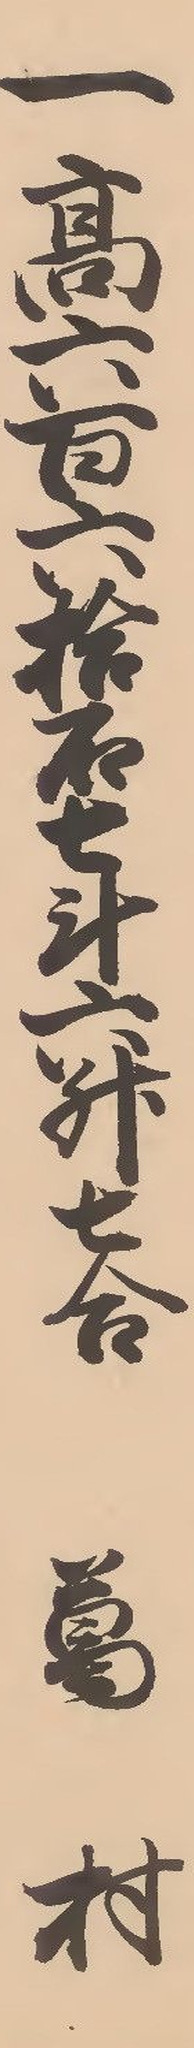一高六百六拾石七斗六升七合葛村
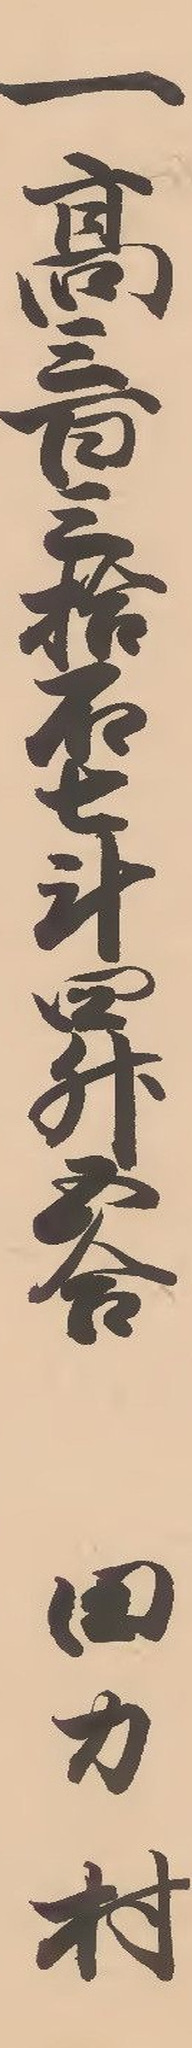一高三百三拾石七斗四升五合田力村
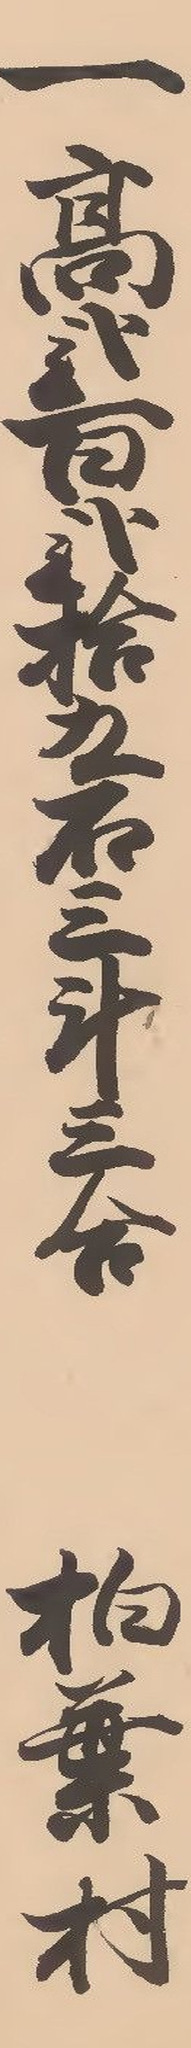一高弐百弐拾九石三斗三合柏葉村
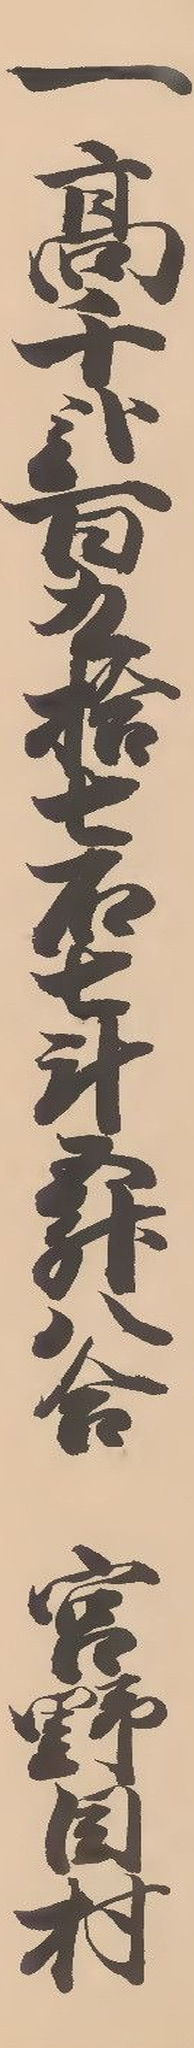一高千弐百九拾七石七斗五升八合宮野目村
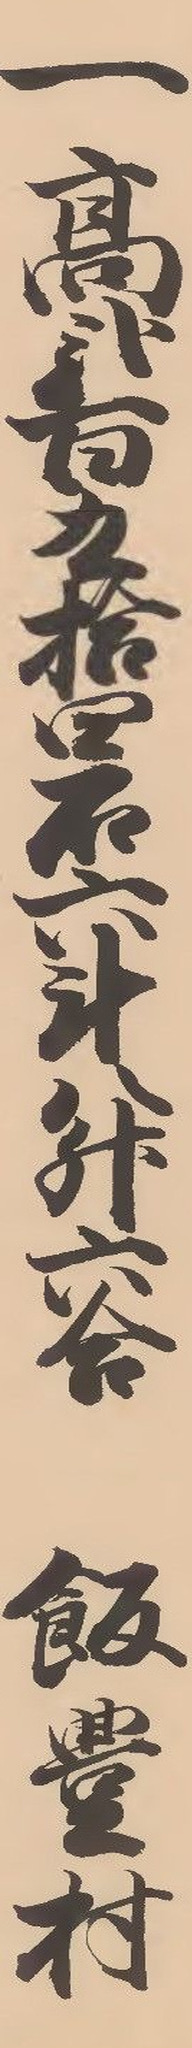一高弐百九拾四石六斗八升六合飯豊村
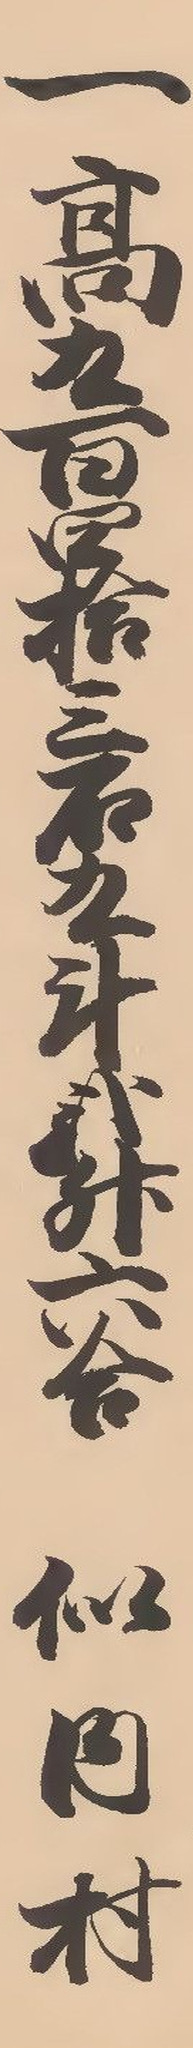一高九百四拾三石九斗弐升六谷似内村
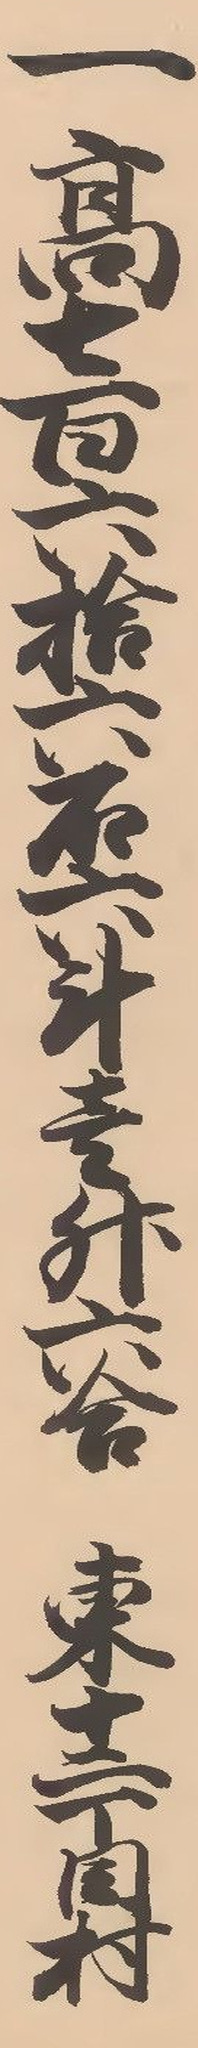一高七百六拾六石六斗壱升六合東十二丁目村

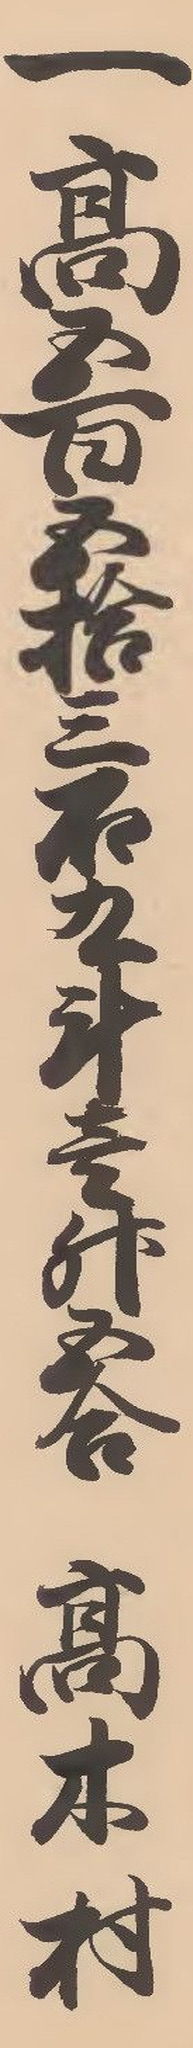一高五百五拾三石九斗壱升五合高木村
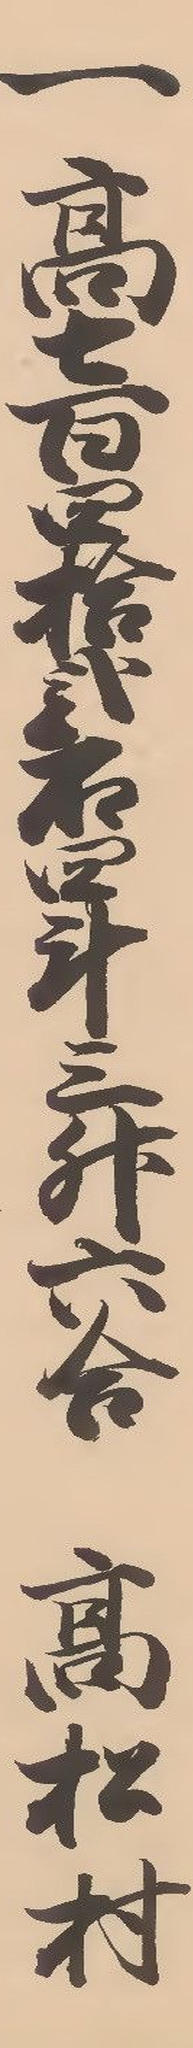一高七百四拾弐石四斗三升六合高松村
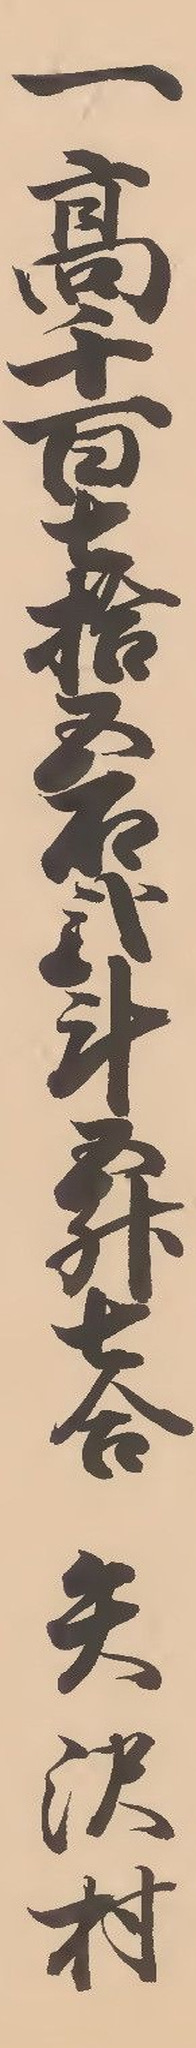一高千百七拾五石弐斗五升七合矢沢村
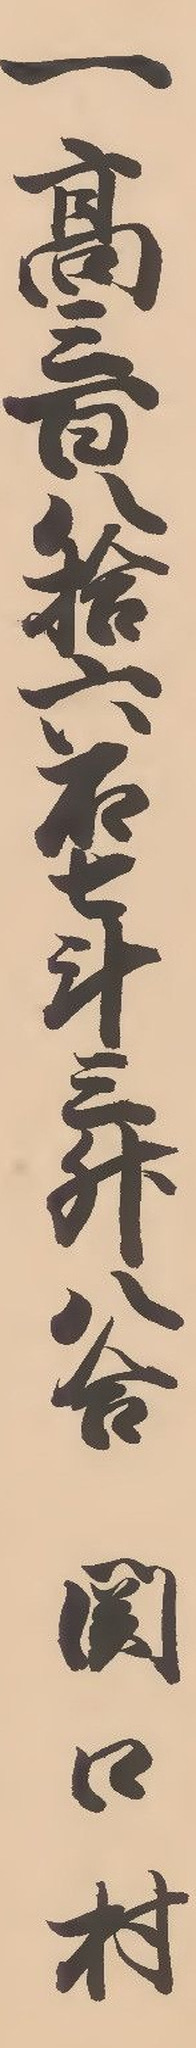一高三百八拾六石七斗三升八合関口村
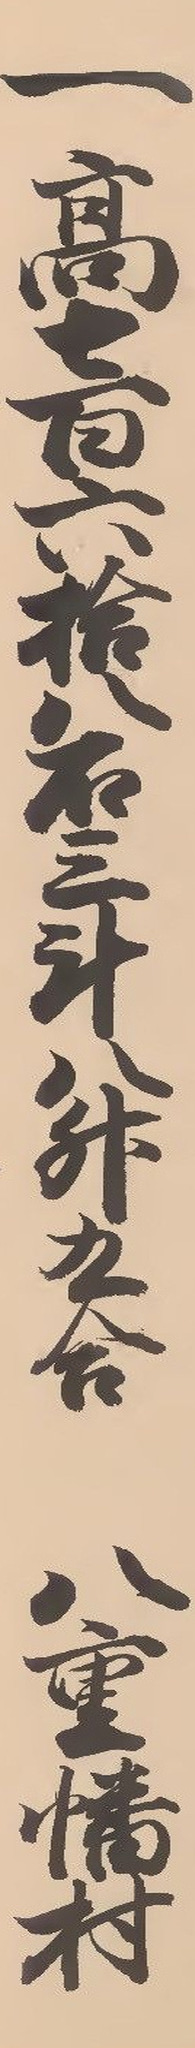一高七百六拾八石三斗八升九合八重幡村
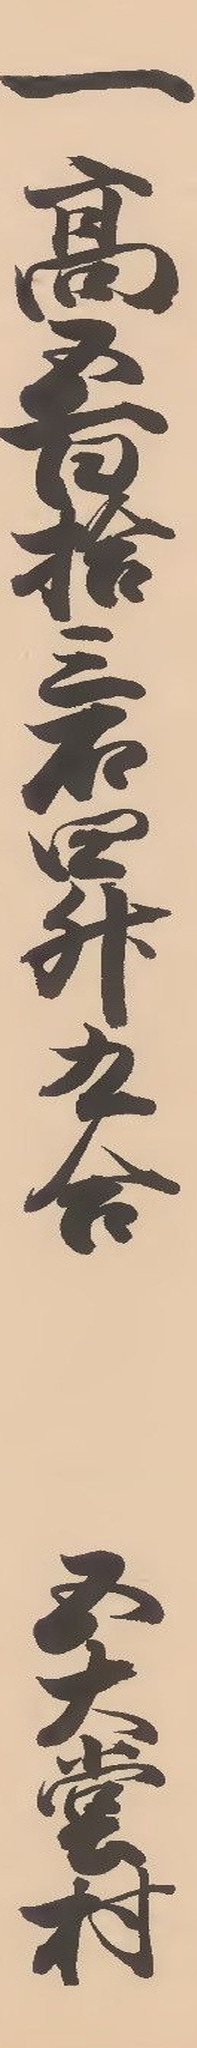一高五百拾三石四升九合五大堂村
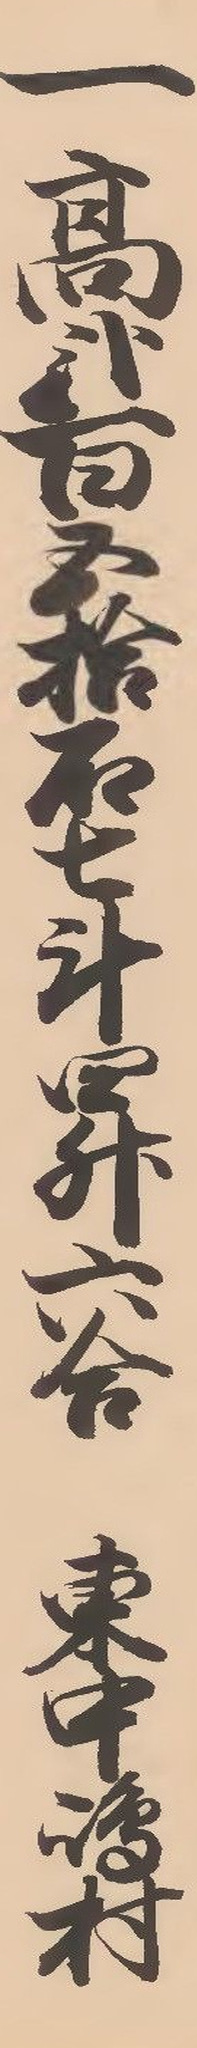一高弐百五拾石七斗四升六合東中島村
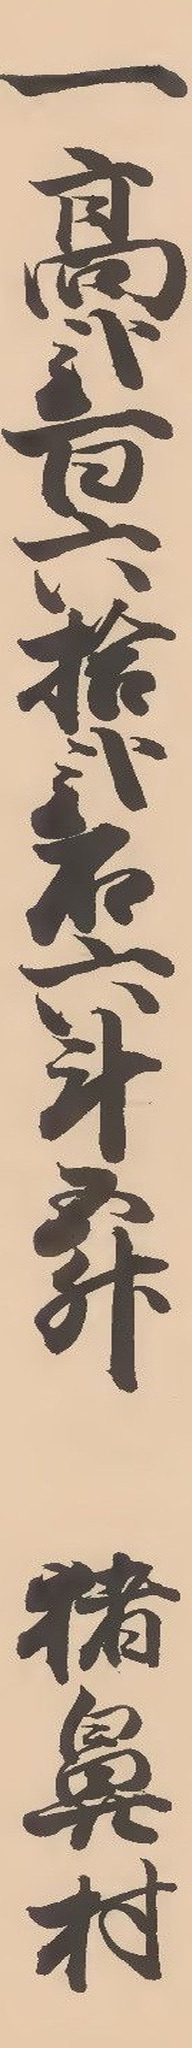一高弐百六拾弐石六斗五升猪鼻村

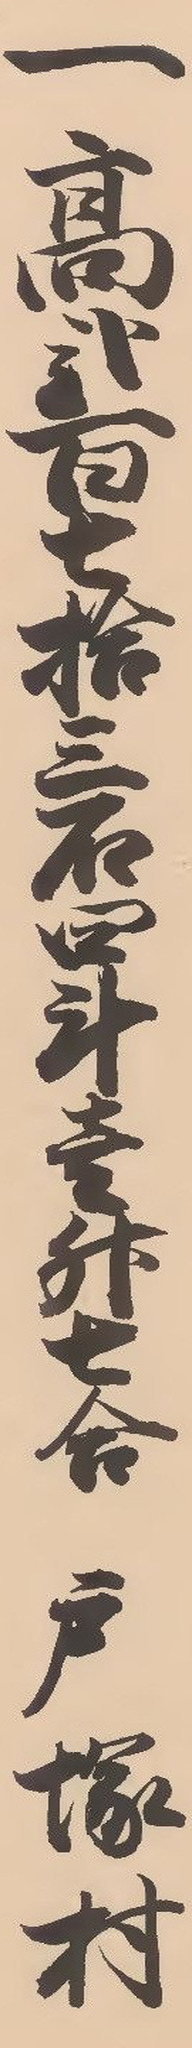一高弐百七拾三石四斗壱升七合戸塚村
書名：陸奥国郷帳　６
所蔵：国立公文書館 National Archives of Japan
